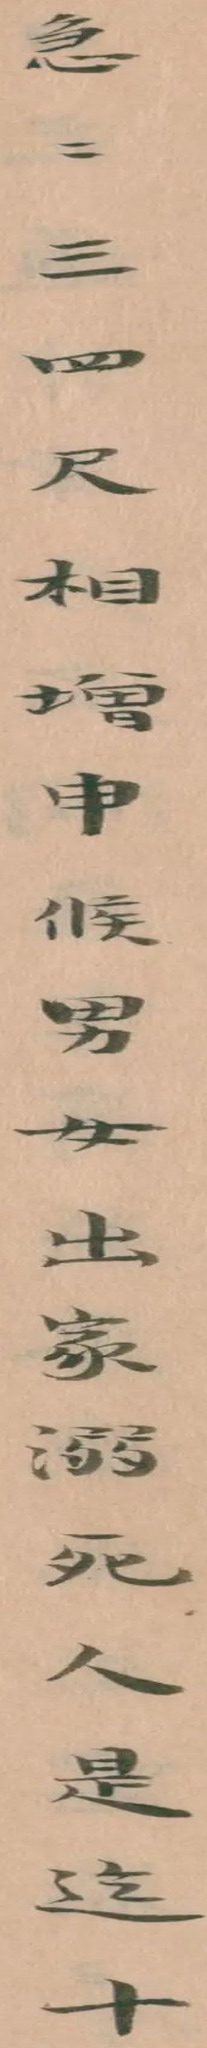急二三四尺相増申候男女出家溺死人是迄十
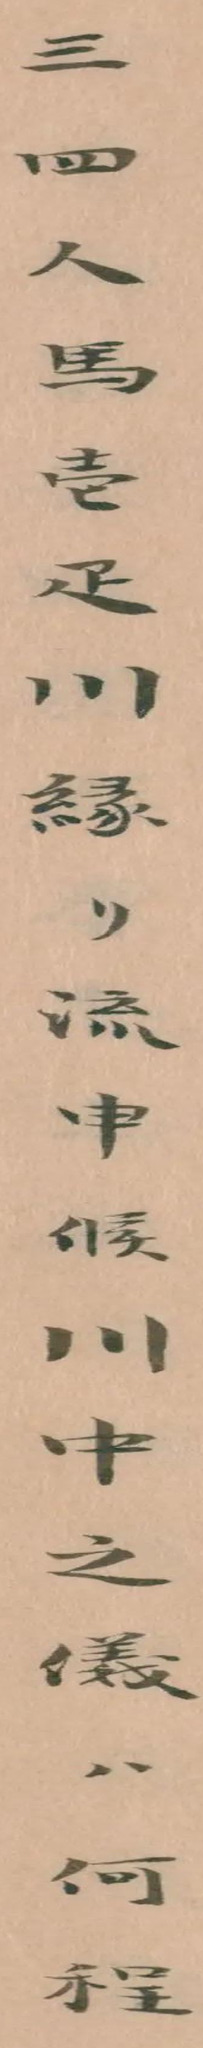三四人馬壱疋川縁リ流申候川中之儀ハ何程
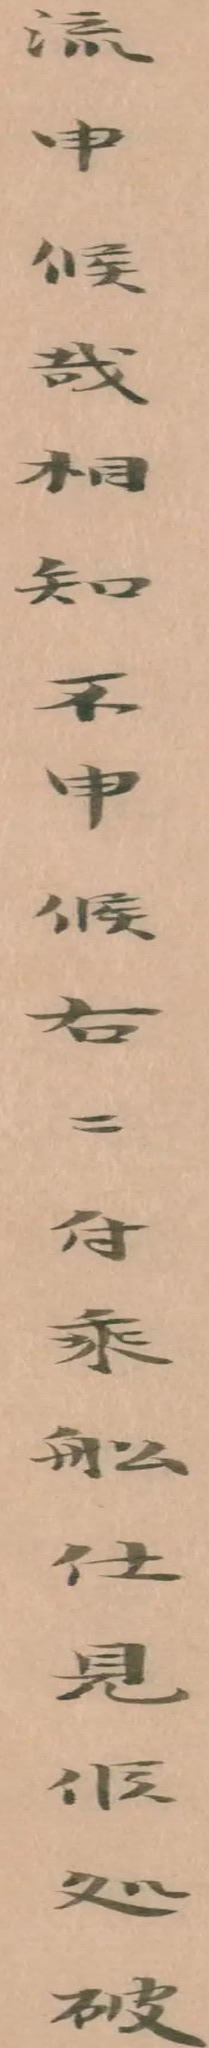流申候哉相知不申候右二付乗船仕見候処破
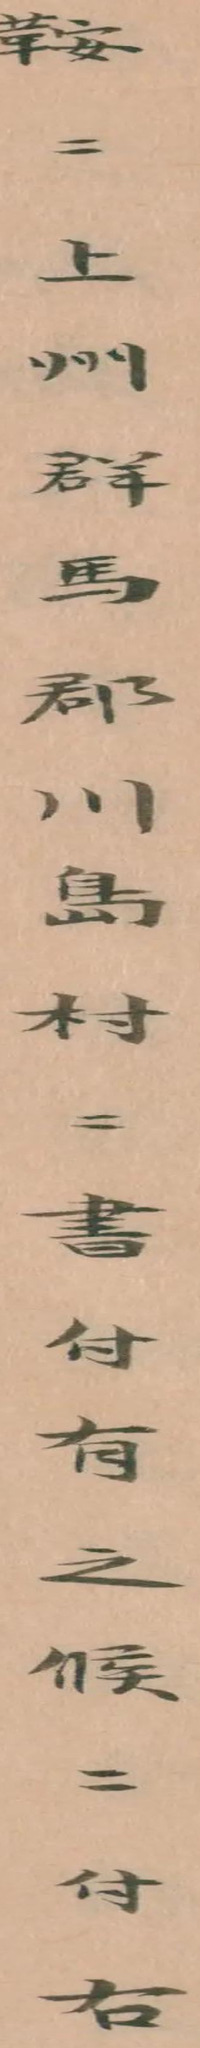鞍二上州群馬郡川島村二書付有之候二付右
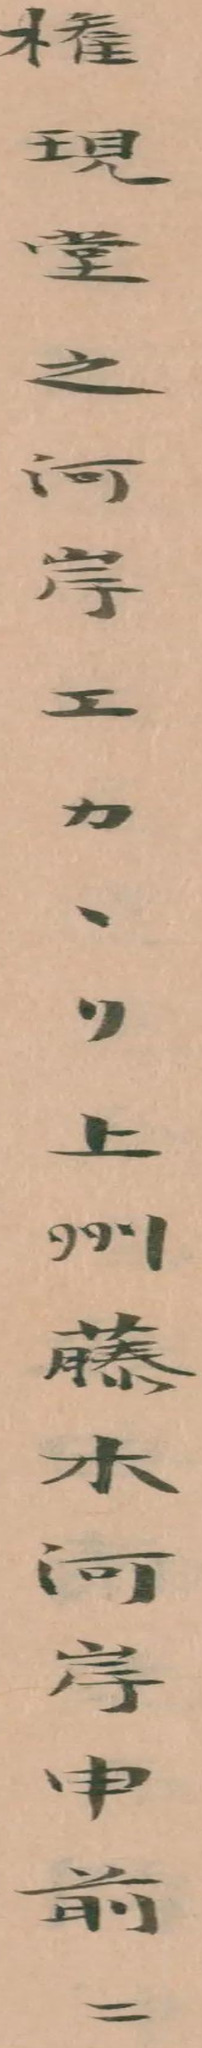権現堂之河岸エカゝリ上州藤木河岸申前二
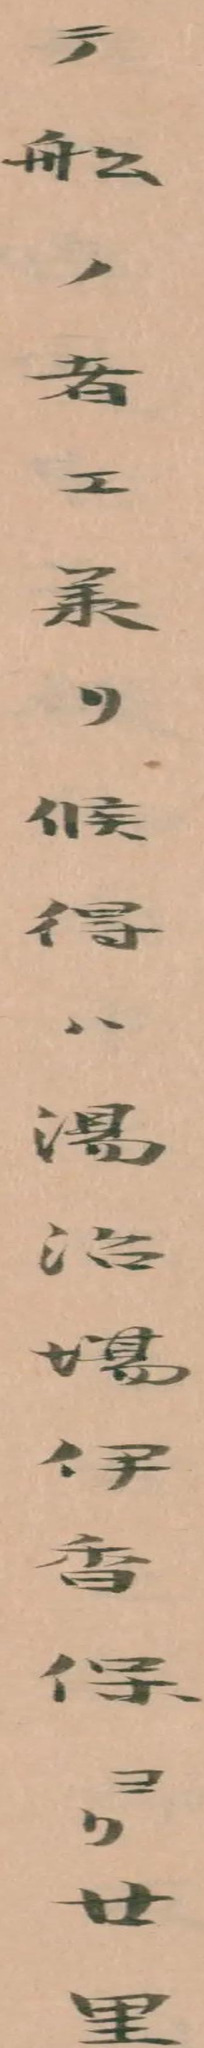テ船ノ者エ承り候得ハ湯治場伊香保ヨリ廿里
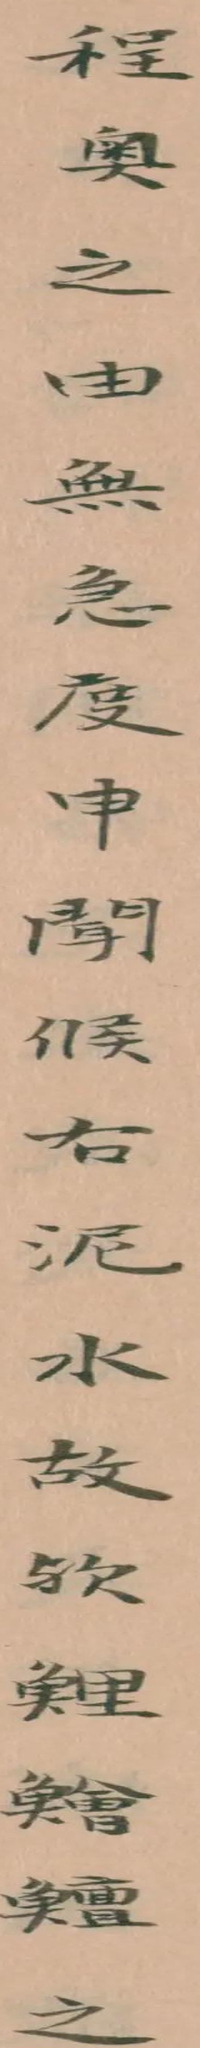程奥之由無急度申聞候右泥水故歟鯉鱠鱣之
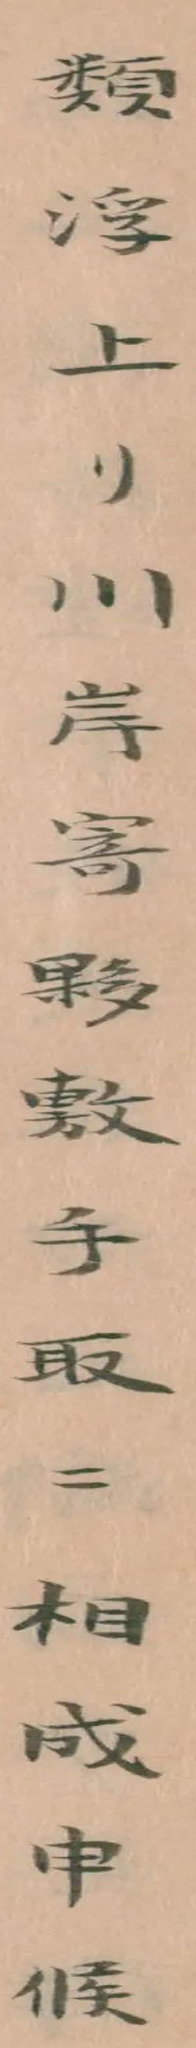類浮上リ川岸寄夥敷手取二相成申候
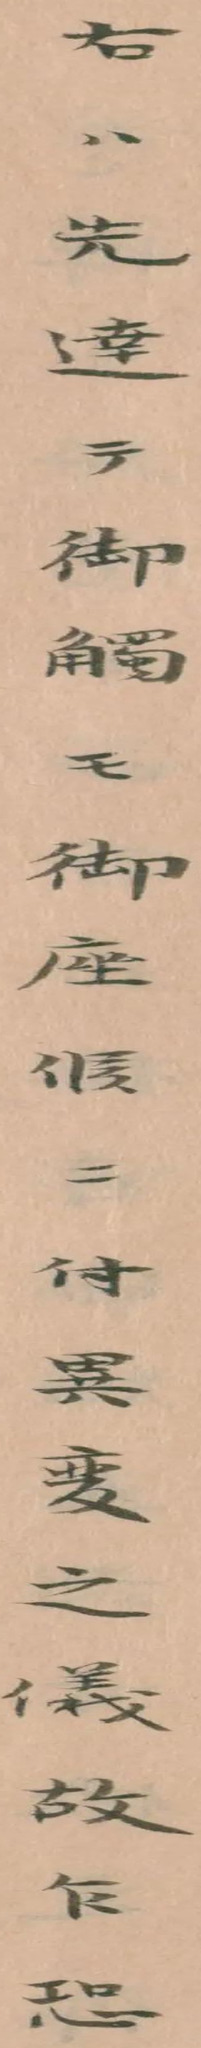右ハ先達テ御触モ御座候二付異変之儀故乍恐
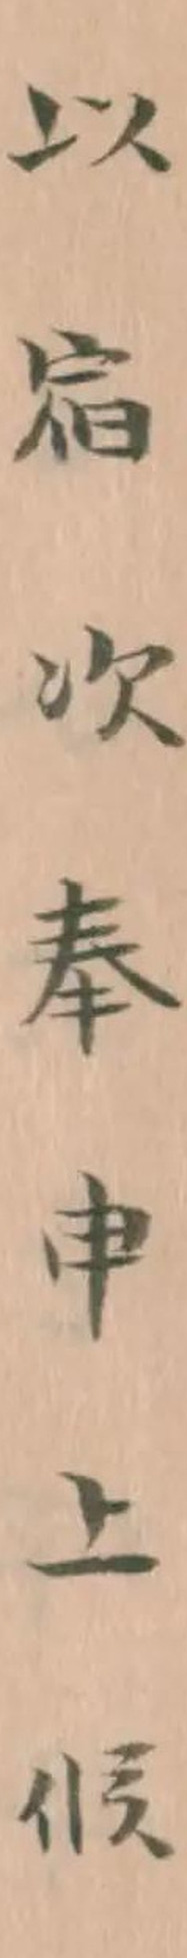以宿次奉申上候
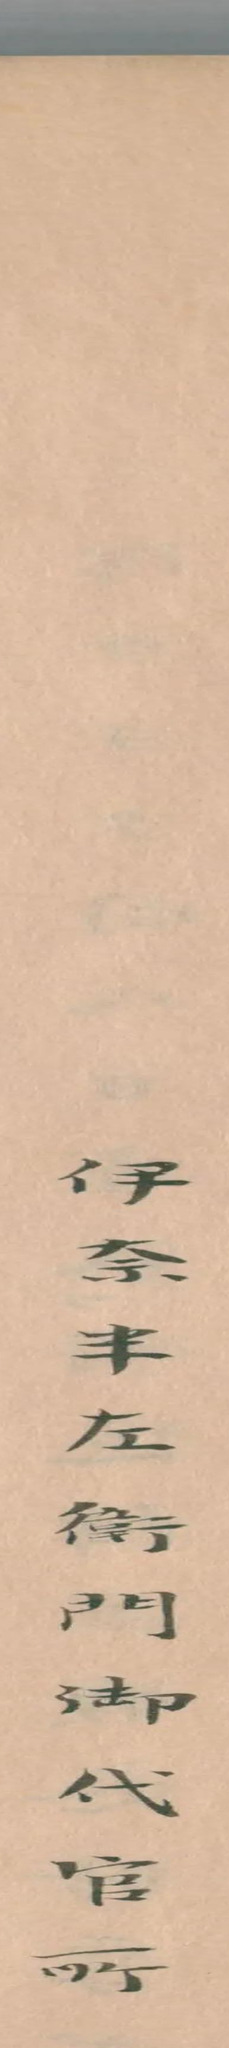伊奈半左衛門御代官所
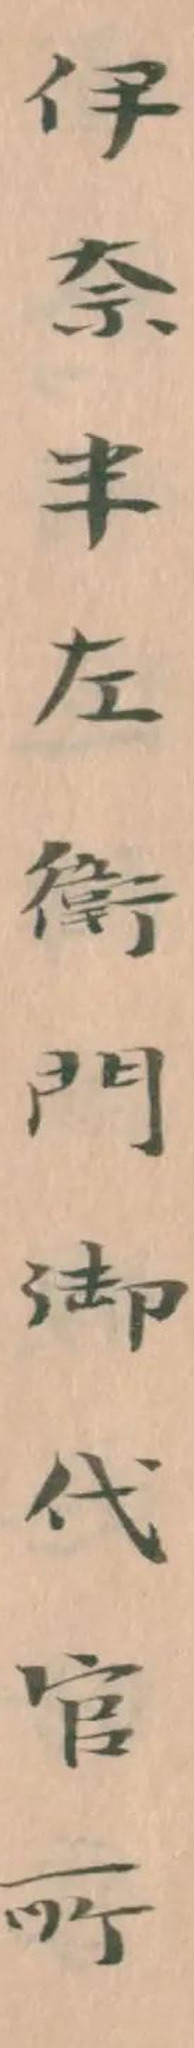伊奈半左衛門御代官所
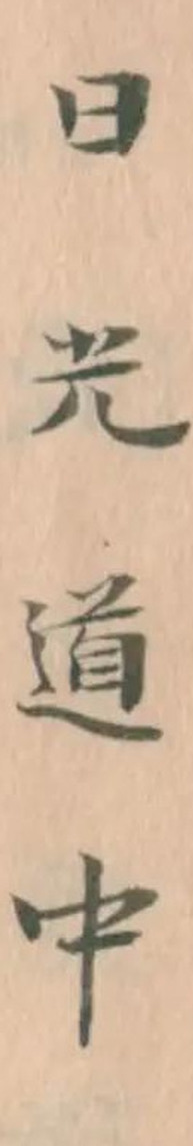日光道中
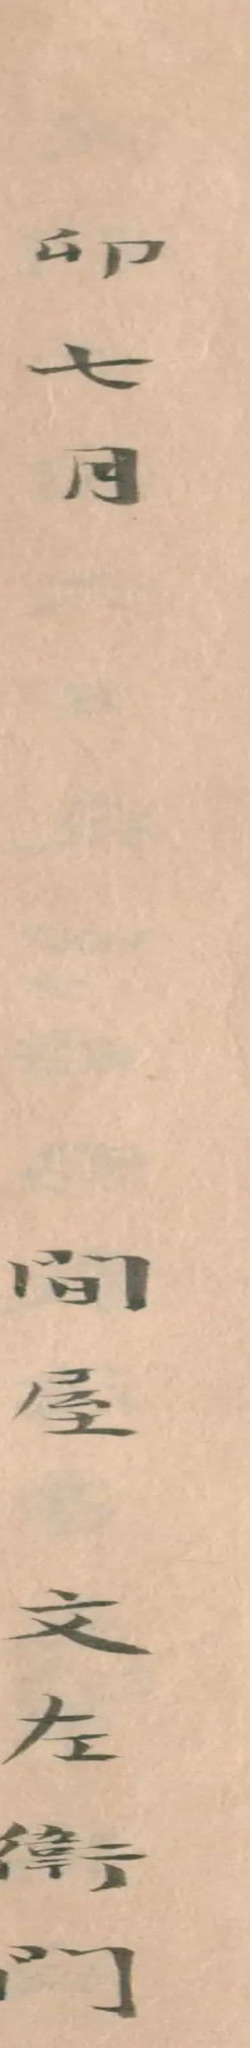卯七月問屋文左衛門
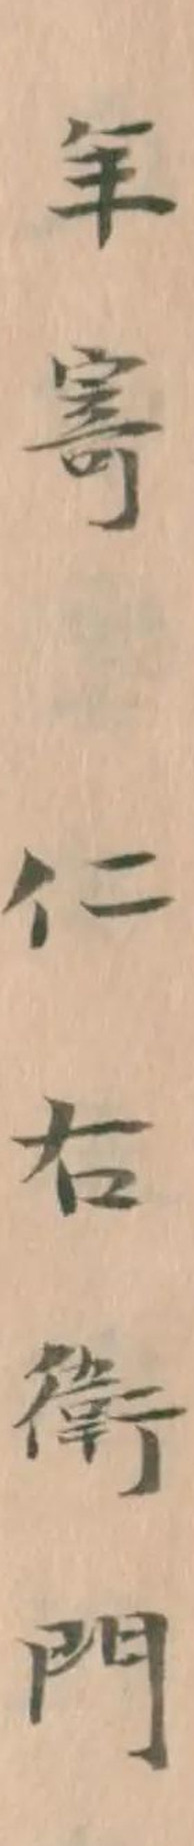年寄仁右衛門
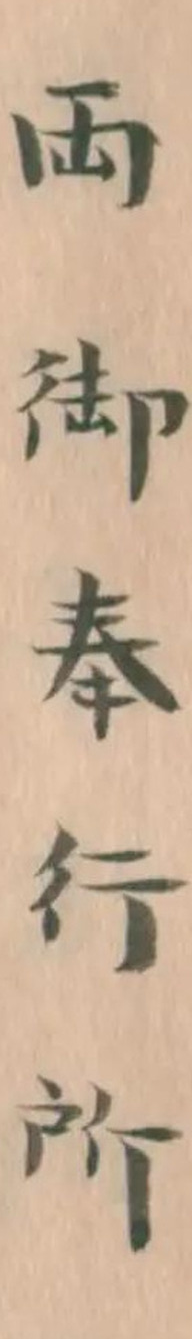両御奉行所
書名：地災撮要. 巻1(噴火山・地震ノ部)
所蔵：国立国会図書館 National Diet Library, JAPAN
